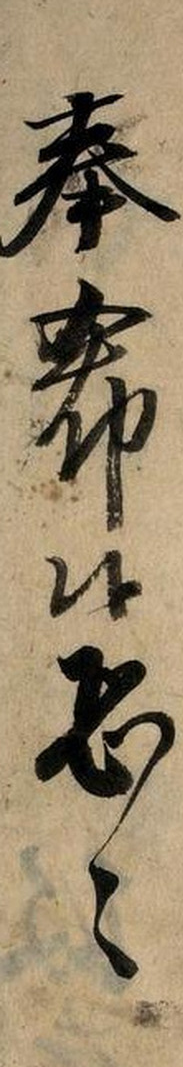奉希候恐々
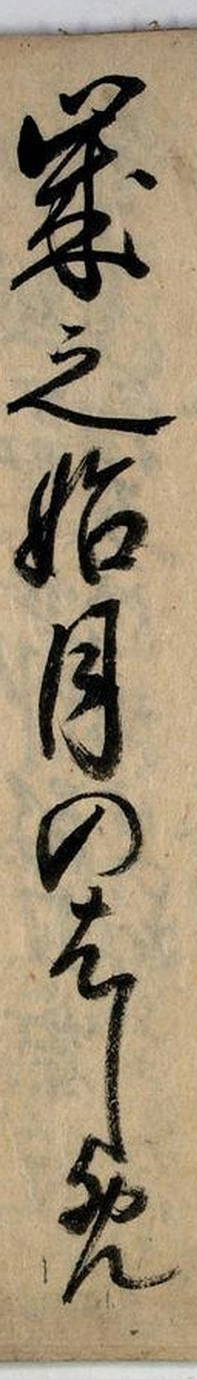歳の始月のはしめ
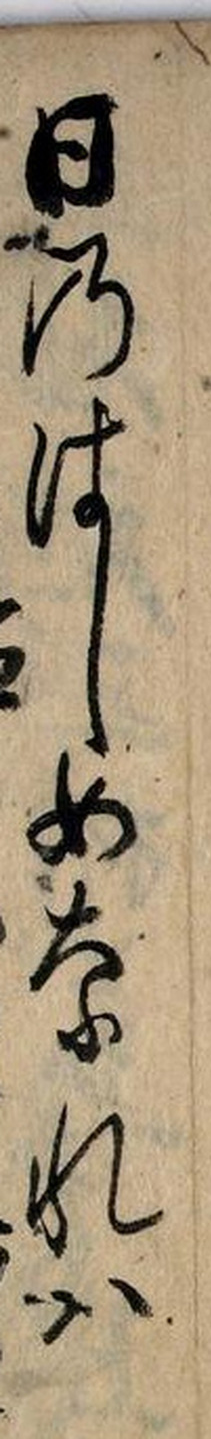日のはしめなれハ

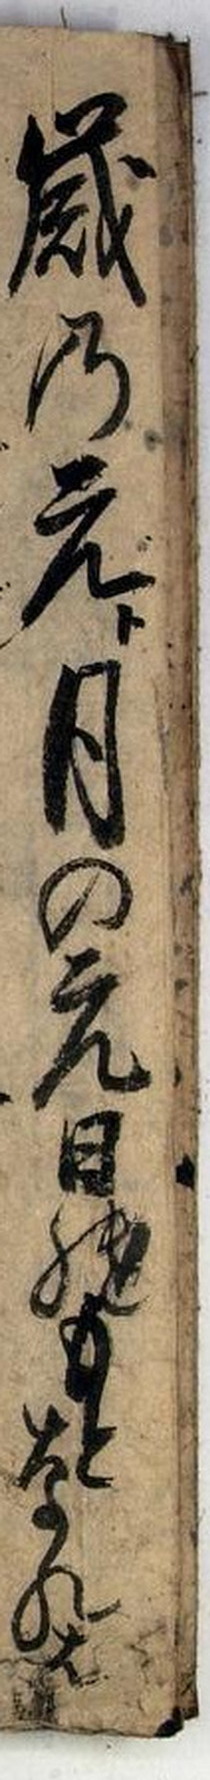歳の元ト月の元日継もとなれは
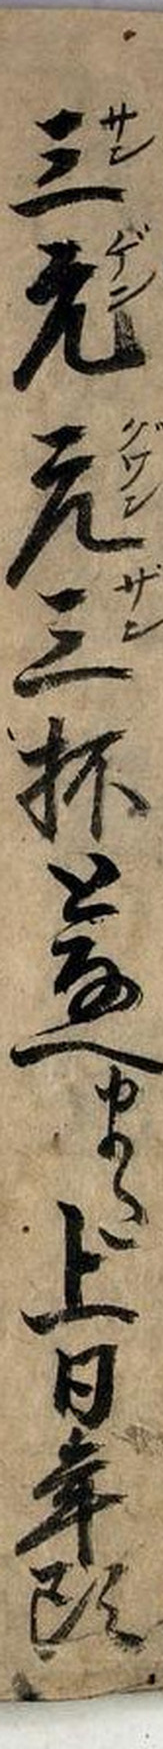三元元三抔となへまた上日年
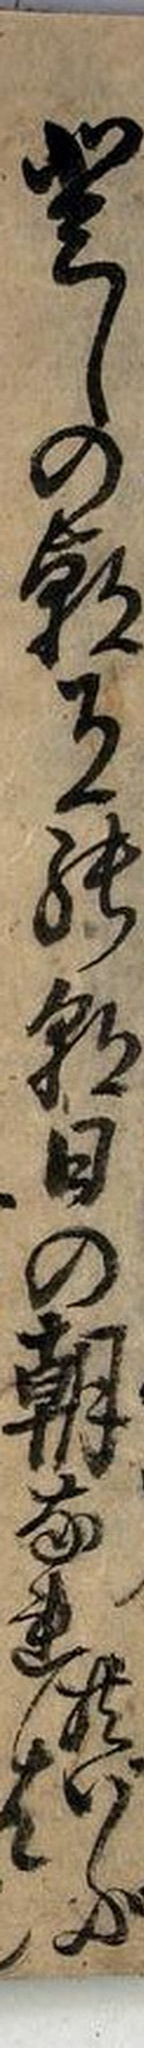としの朝月の朝日の朝なれは
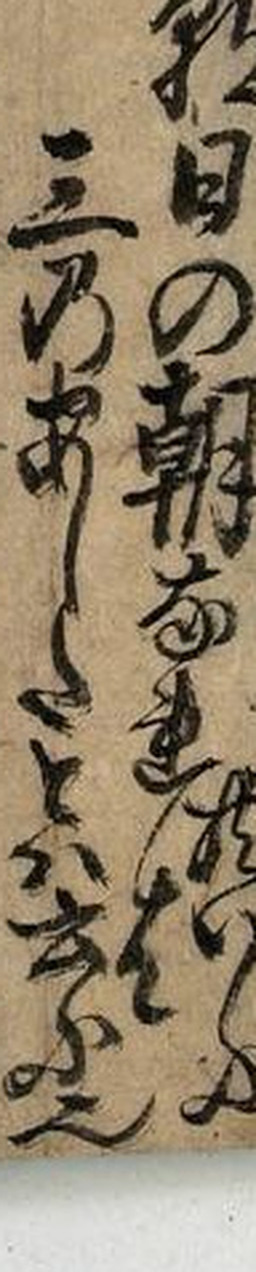三のあしたとハ云ふ也
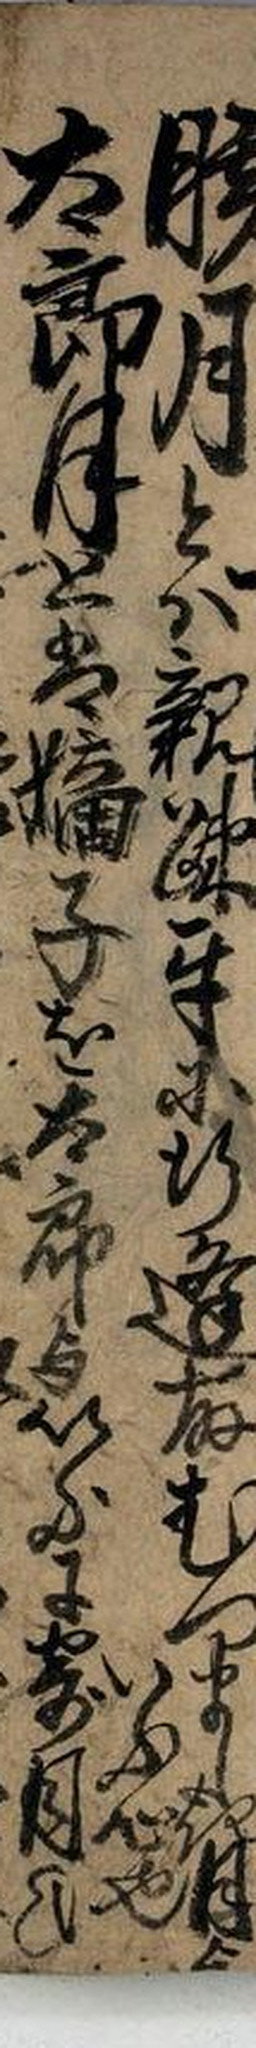太郎月とは嫡子を太郎といふに寄月之
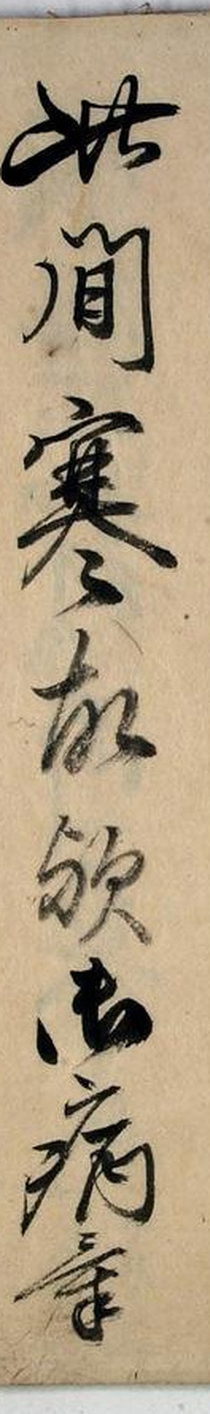此間寒故歟御病気
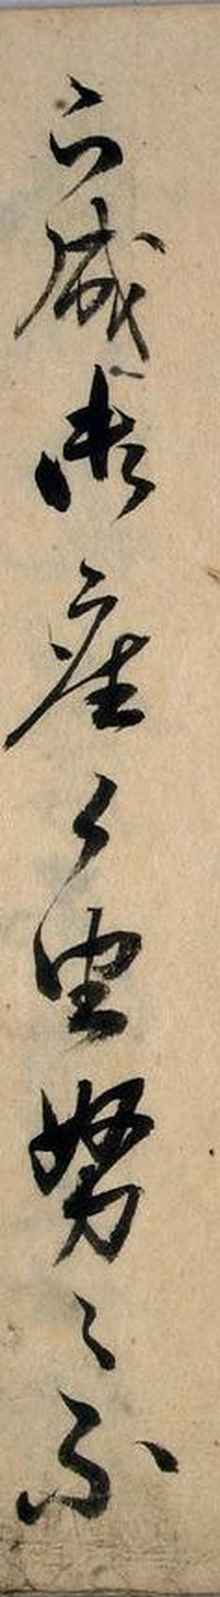被成御座候由努々不

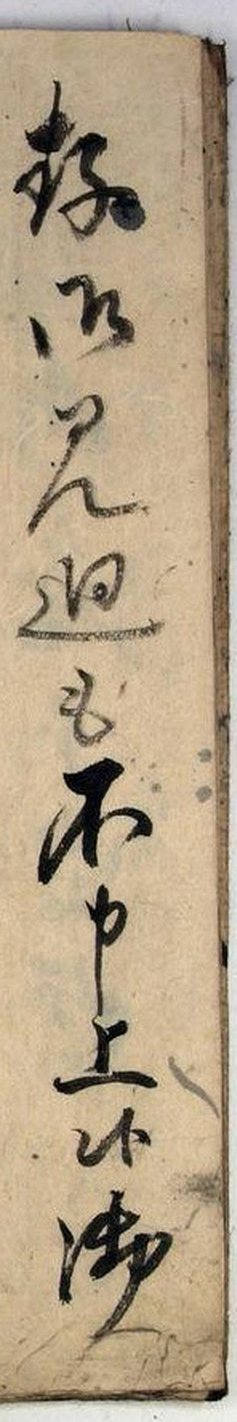存御見廻も不申上候御
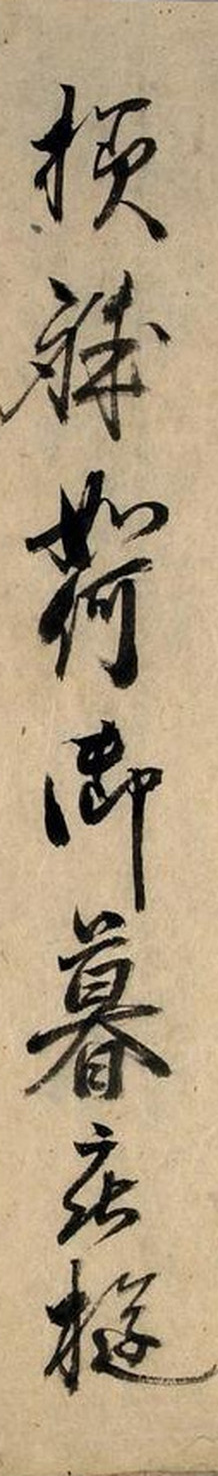様躰如何御暮被遊
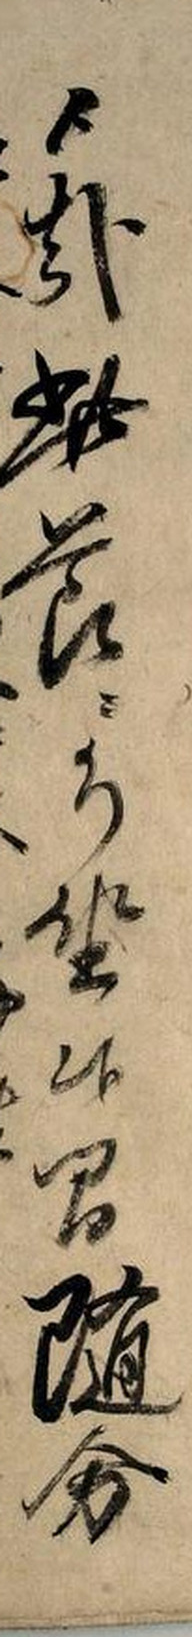候哉此節ニ御座候間随分
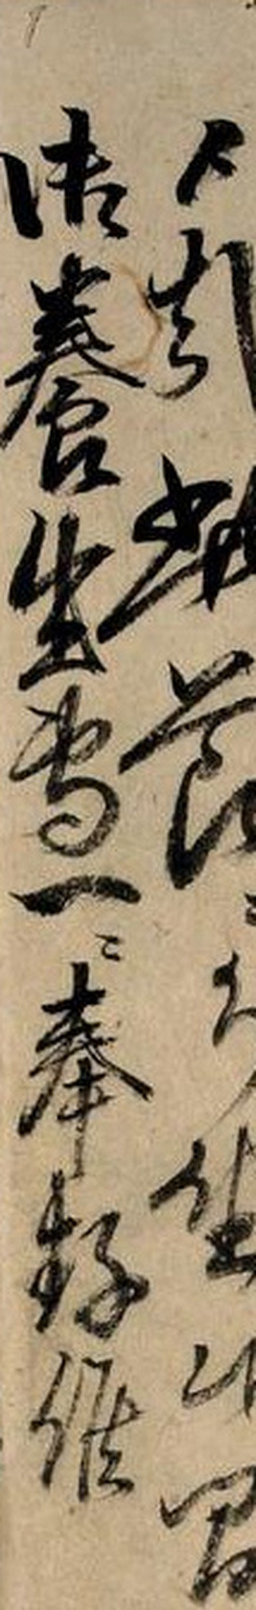御養生専一ニ奉存候
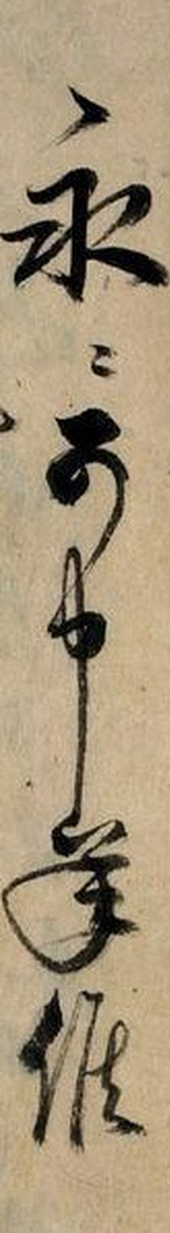永々可申承候
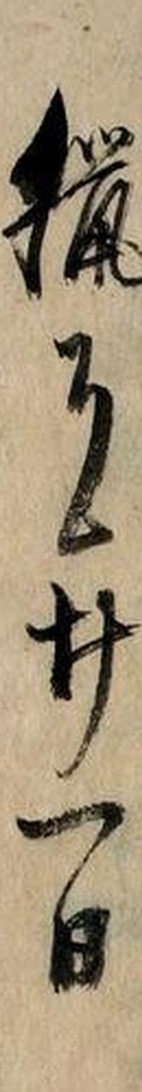臘月廿一日
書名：御手本（手習、小川浦大網に鯨掛り生捕候由ニ付）
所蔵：福井県文書館 Fukui Prefectural Archives
